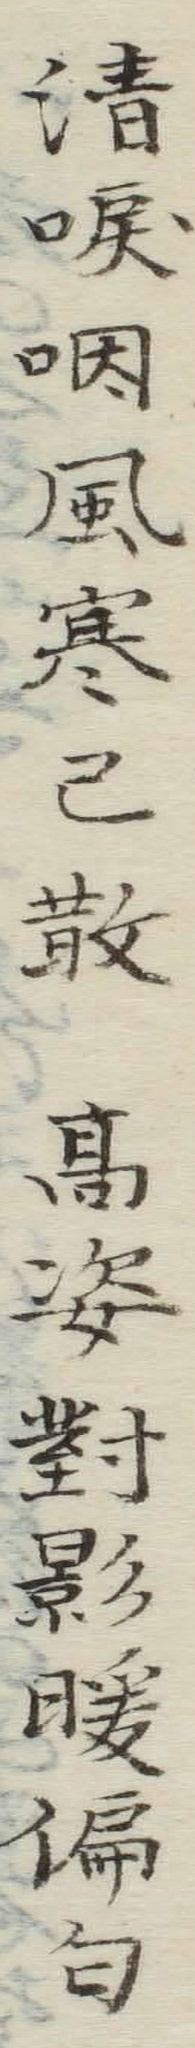清唳咽風寒己散高姿対影暖偏匂
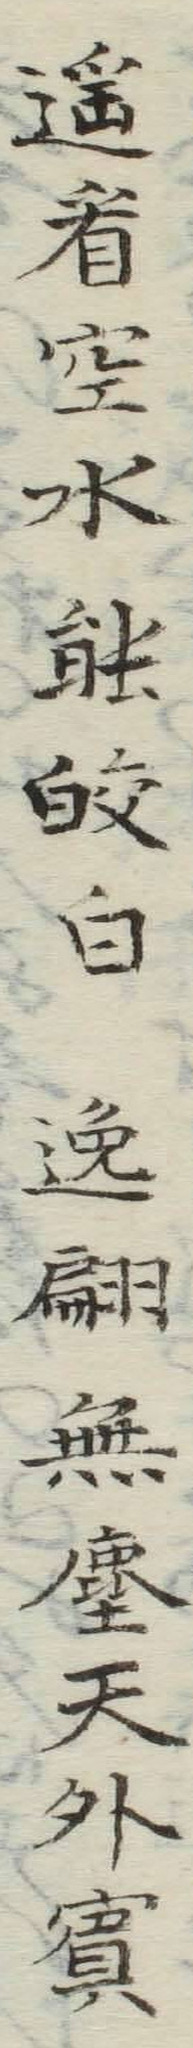遥看空水能皎白逸翻無塵天外賓
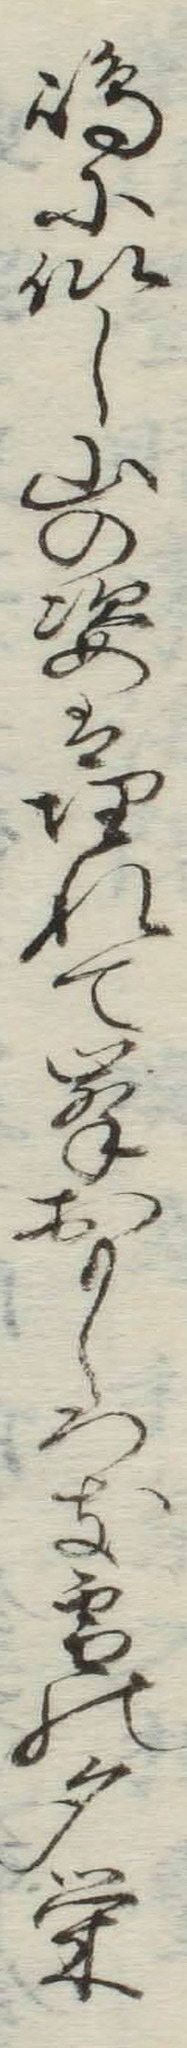嶋に似し山の姿は埋れて峯おもしろき雪の夕栄
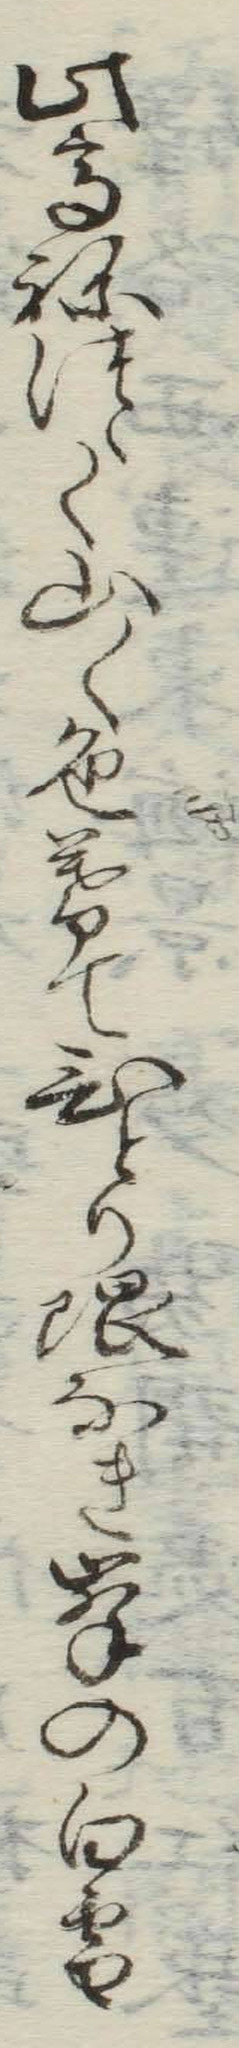此高ねつゝく山〳〵色暮てひとり隈なき峯の白雪
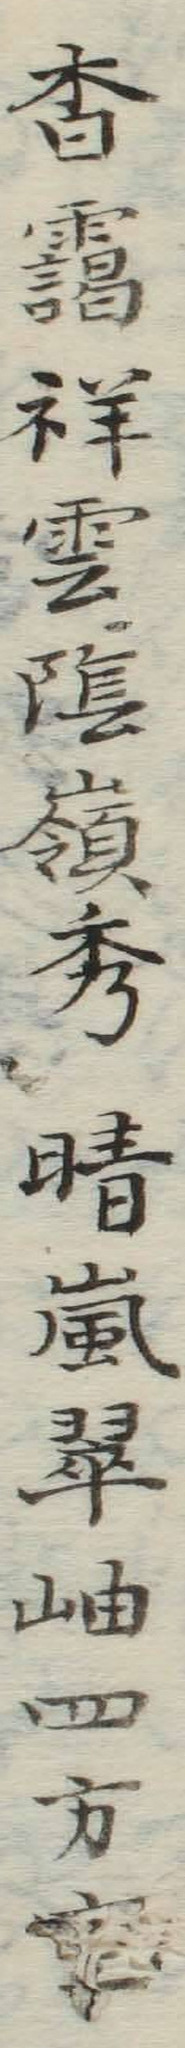杳靄祥雲陰嶺秀晴嵐翠岫四方空
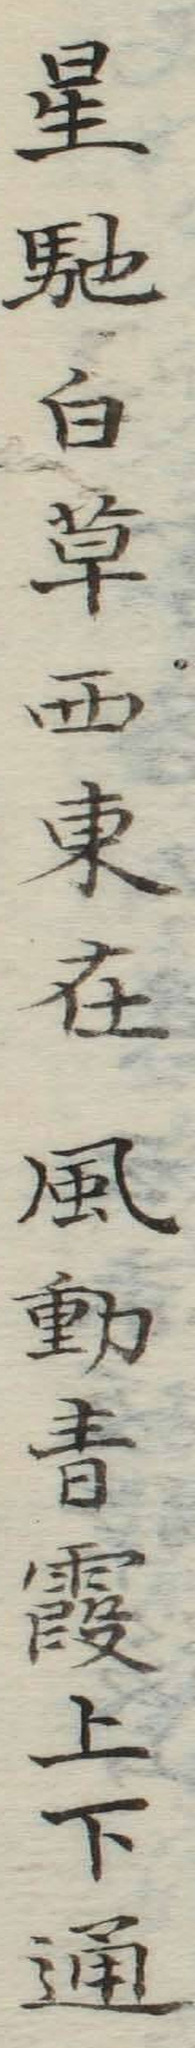星馳白草西東在風動青霞上下通
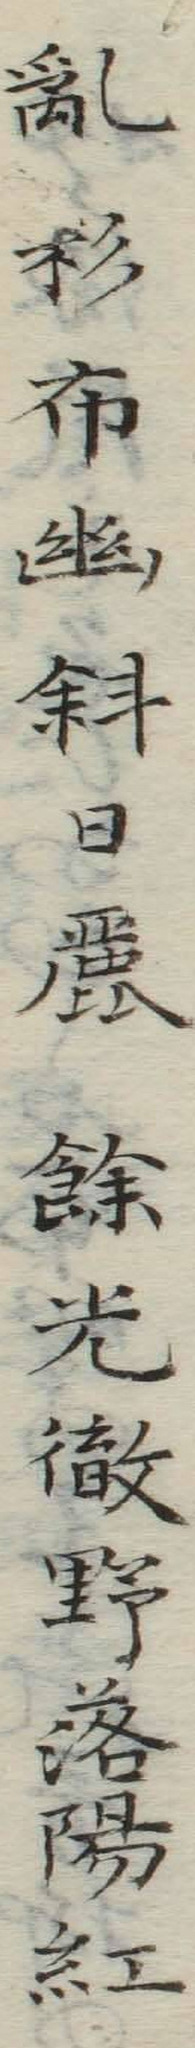乱布幽斜日麗余光徹野落陽紅
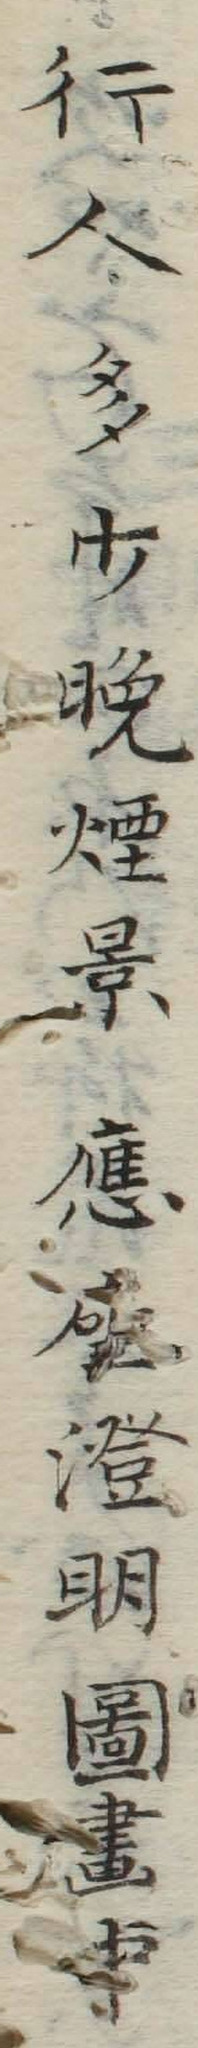行人多少晩煙景應座澄明図画中

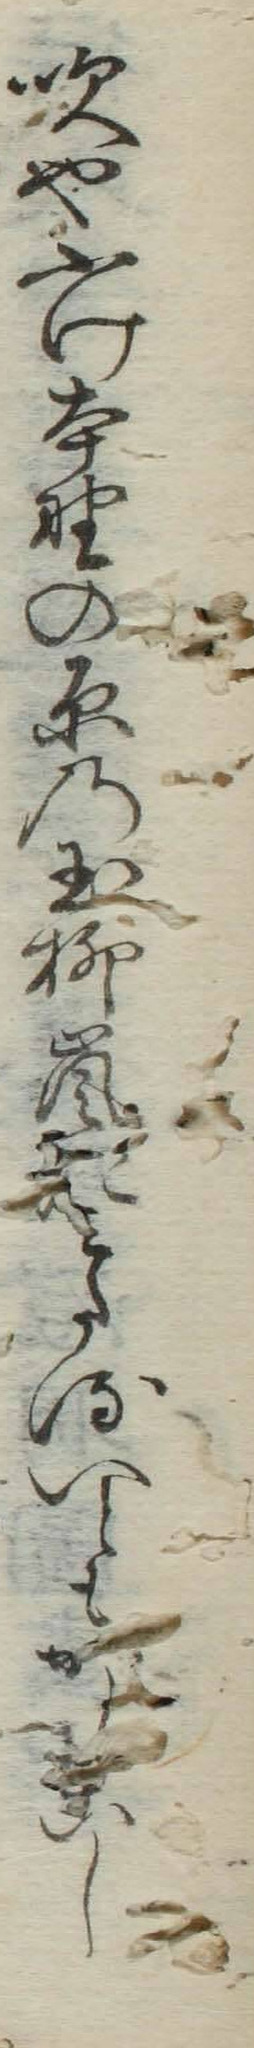吹やふけ本野の原の玉柳嵐にみたるいともかしこし
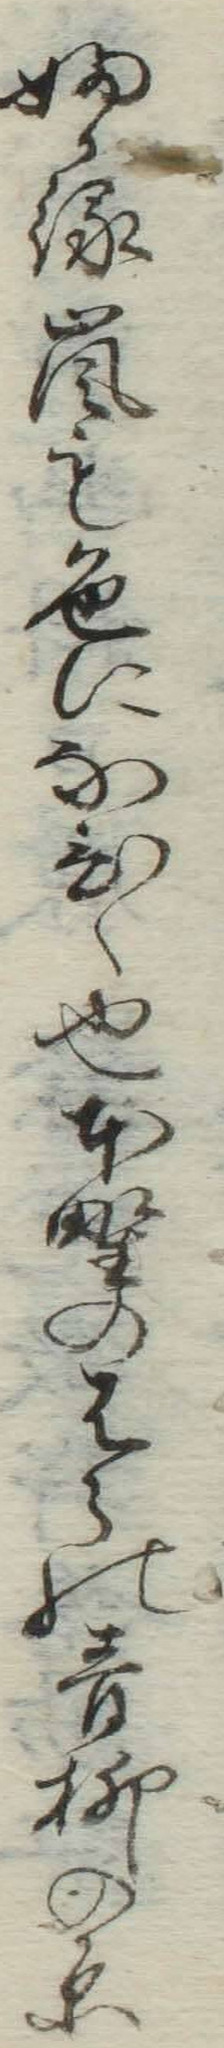ふか緑嵐も色になひく也本野のはらの青柳の原
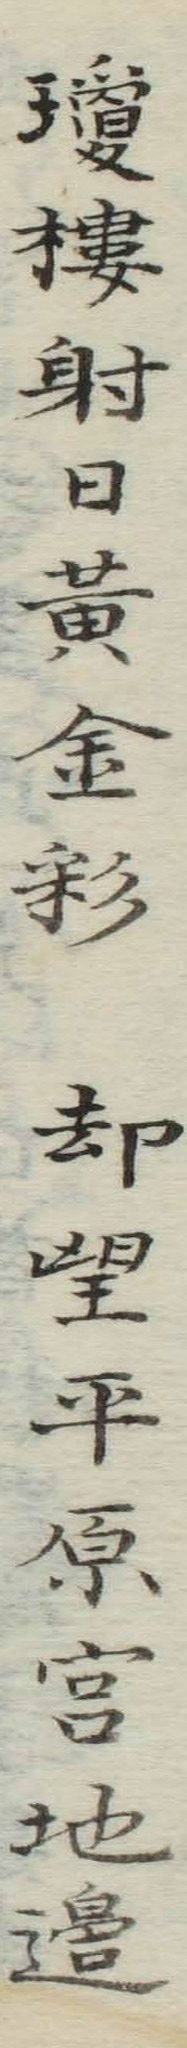瓊楼射日黄金彩却望平原宮地邉
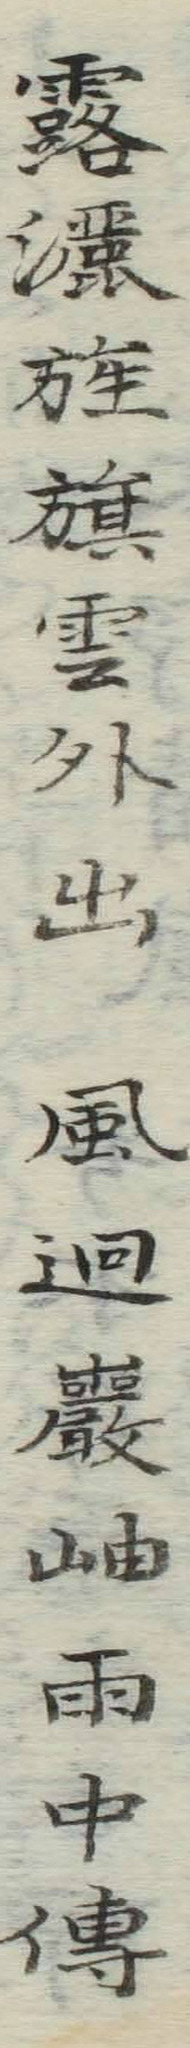露洒旌旗雲外出風廻巌岫雨中伝
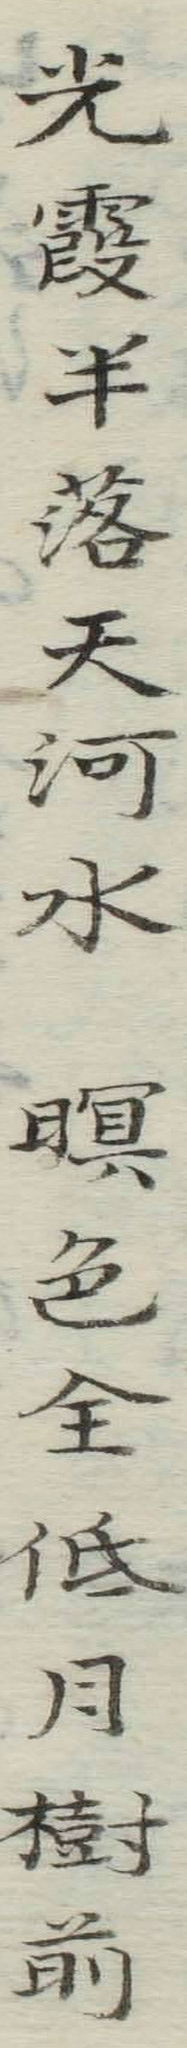光霞半落天河水瞑色全低月樹前
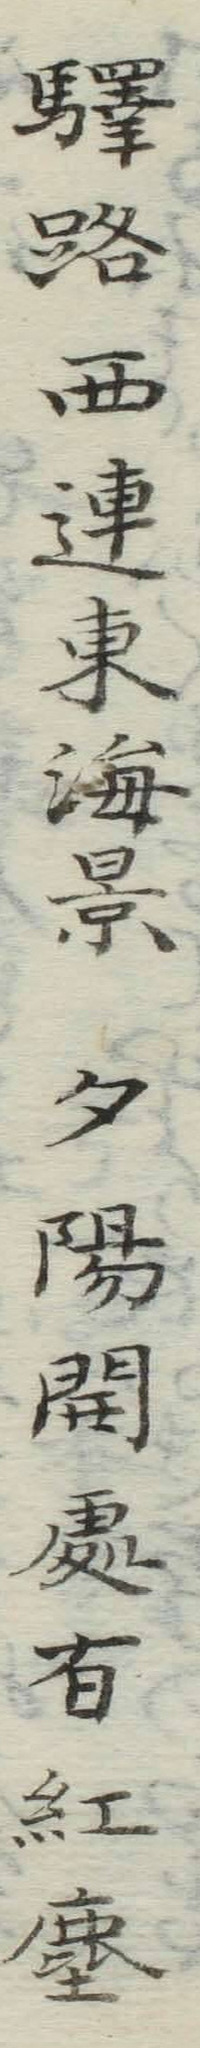駅路西連東海景夕陽開処有紅塵
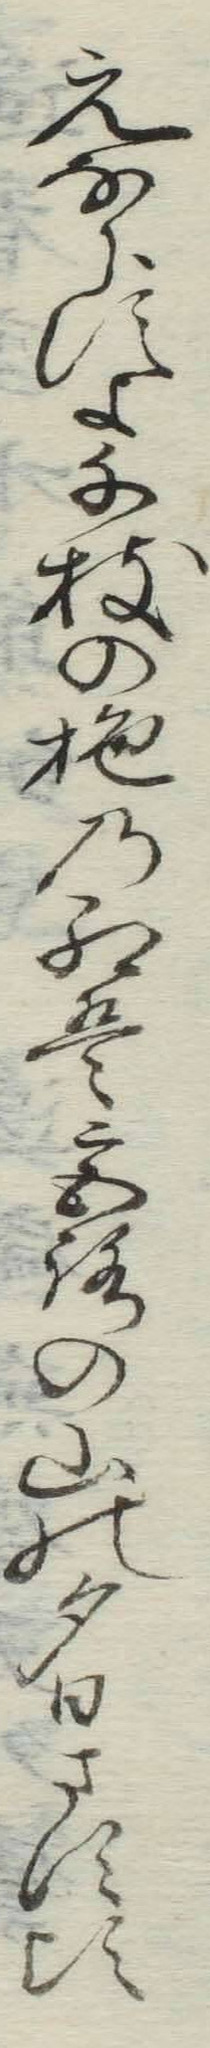えならすよ千枝の栬の紅は宮路の山の夕日さす頃
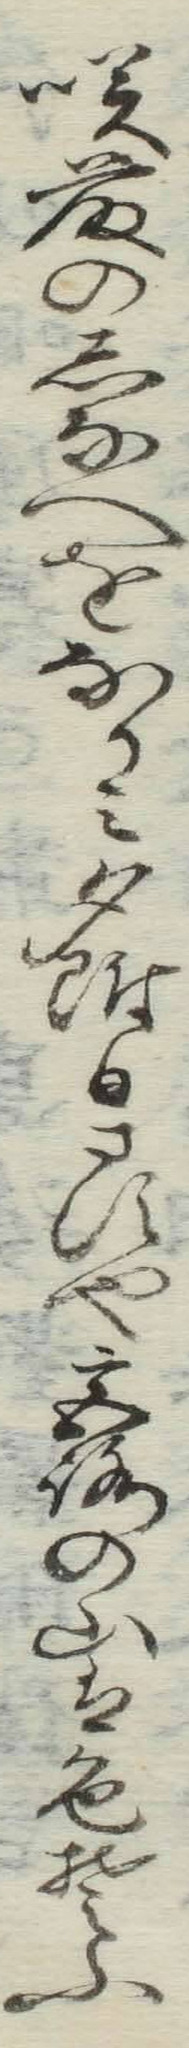咲藤のしなへをなかみ夕附日さすや宮路の山は色そふ
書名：三河国二葉松
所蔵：国文学研究資料館
